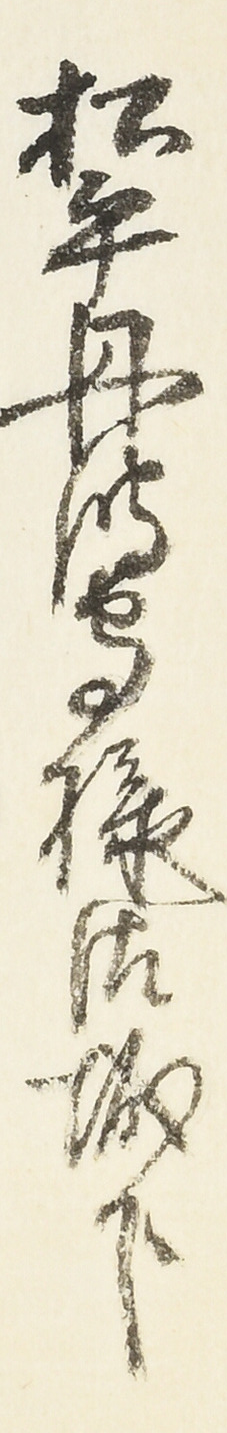松平丹波守様御城下
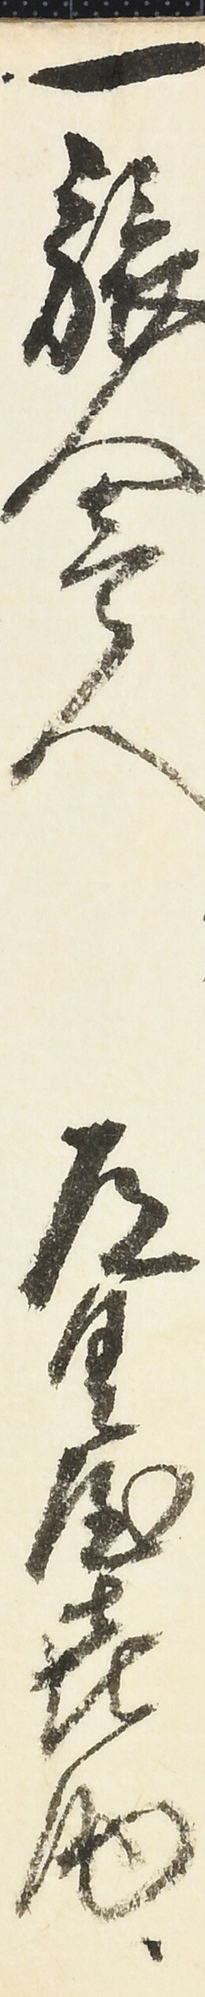一旅人壱人道具屋喜助・
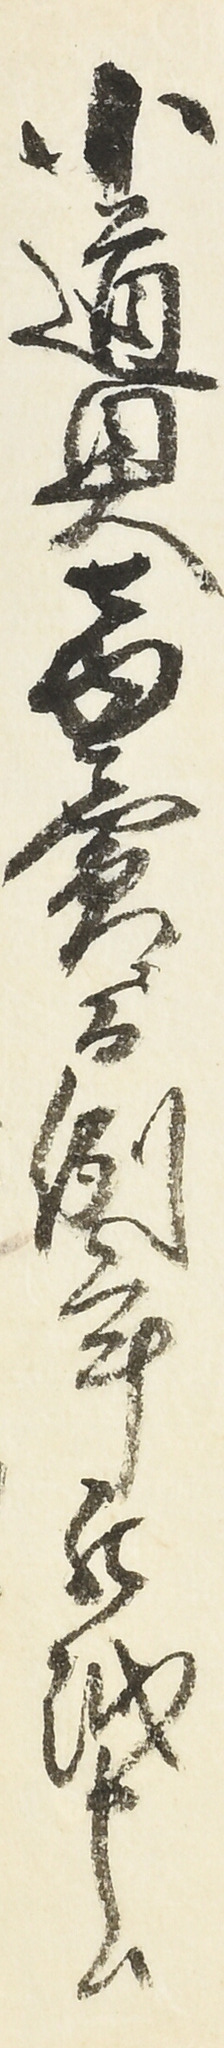小道具商売ニ而例年罷越申候
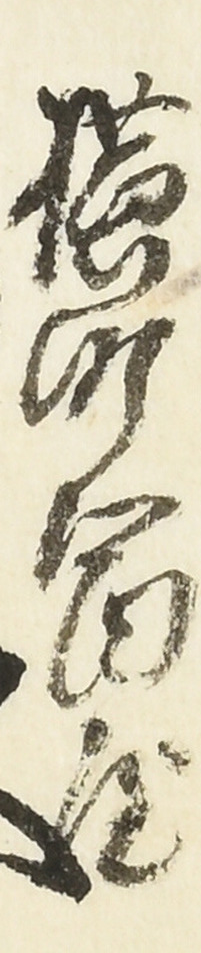横町冨屋
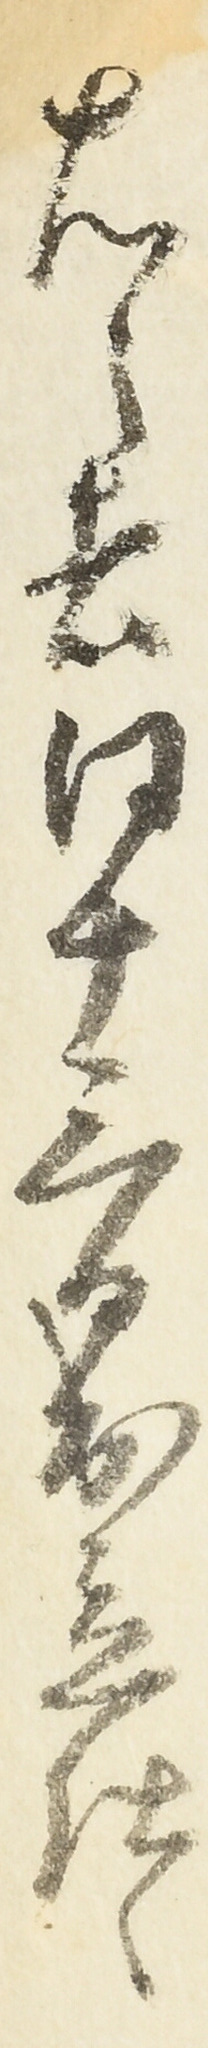右之者同十三日出立仕候

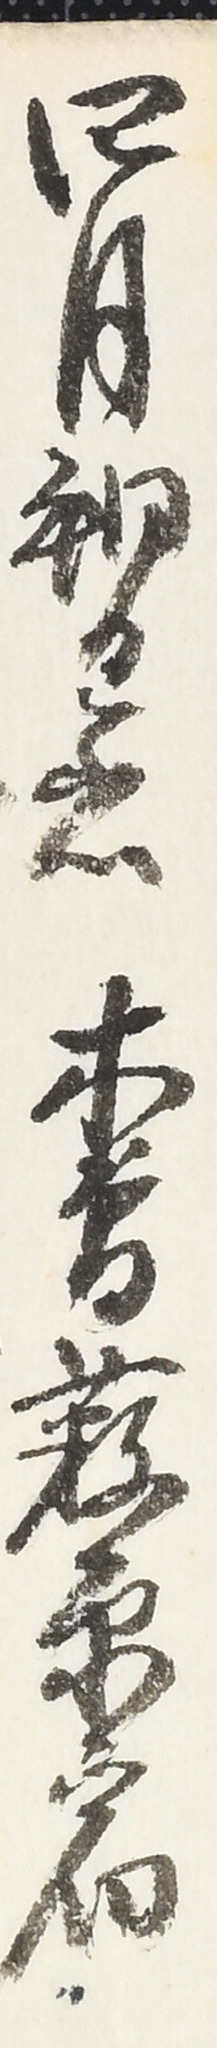四月朔日着木曽藪原宿
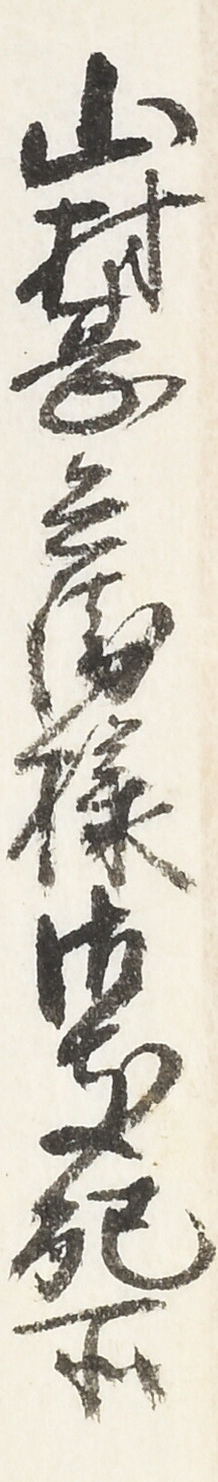山村甚兵衛様御支配所
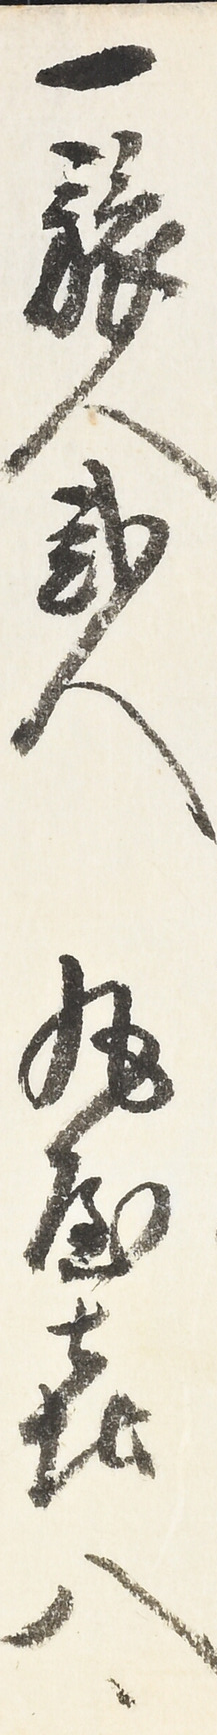一旅人弐人丸屋喜八・
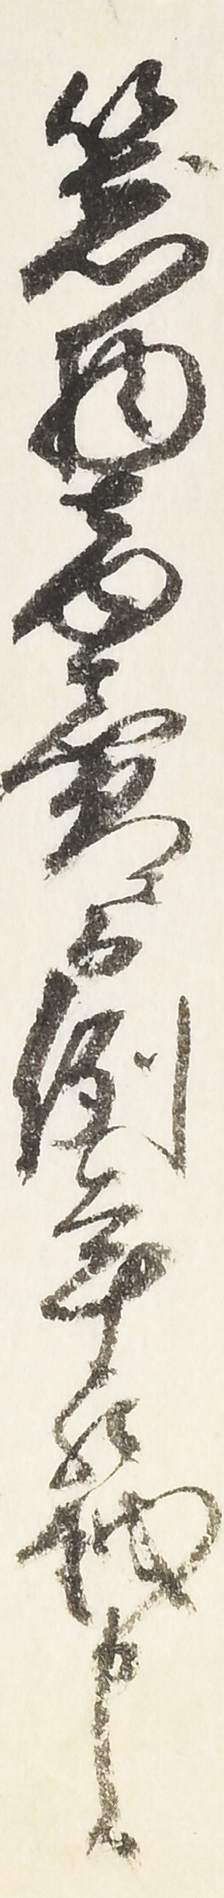器物商売ニ而例年罷越申候
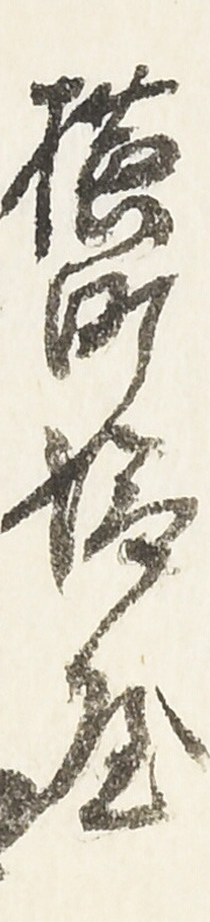横町塩屋
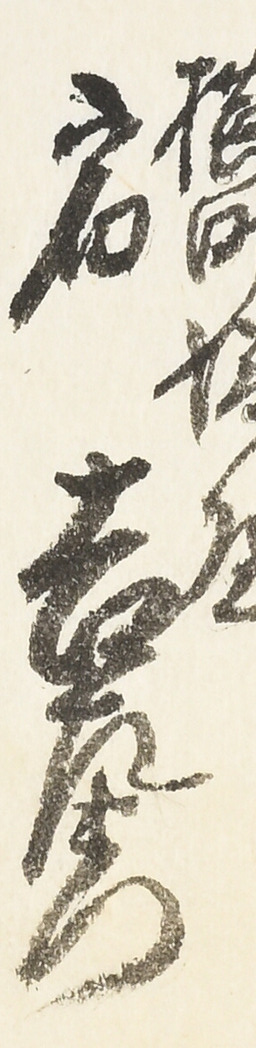宿吉左衛門
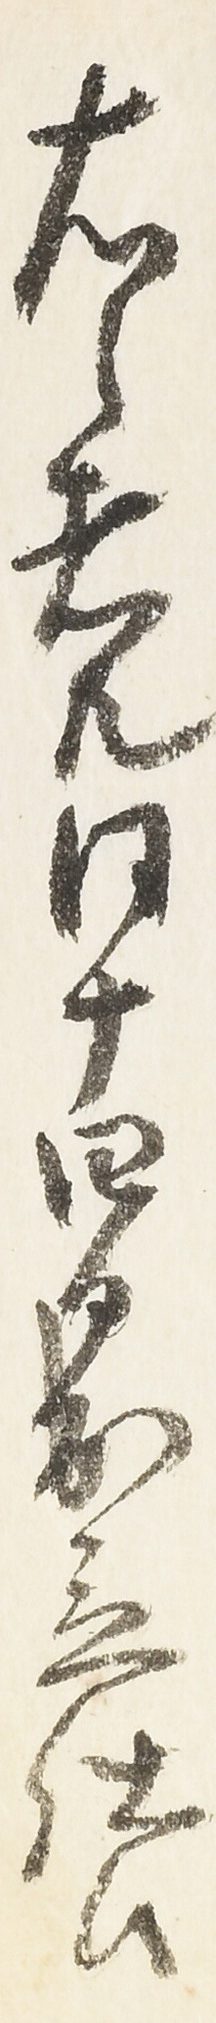右之者共同十四日出立仕候
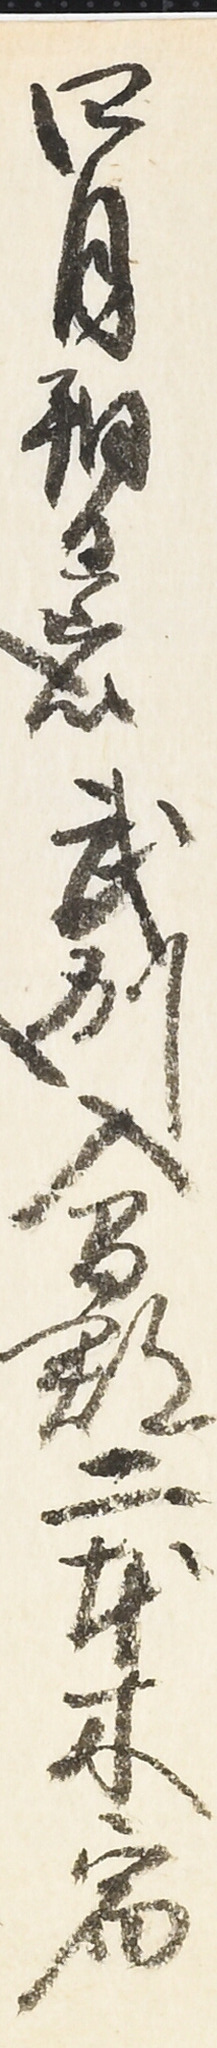四月朔日着武州入間郡二本木宿
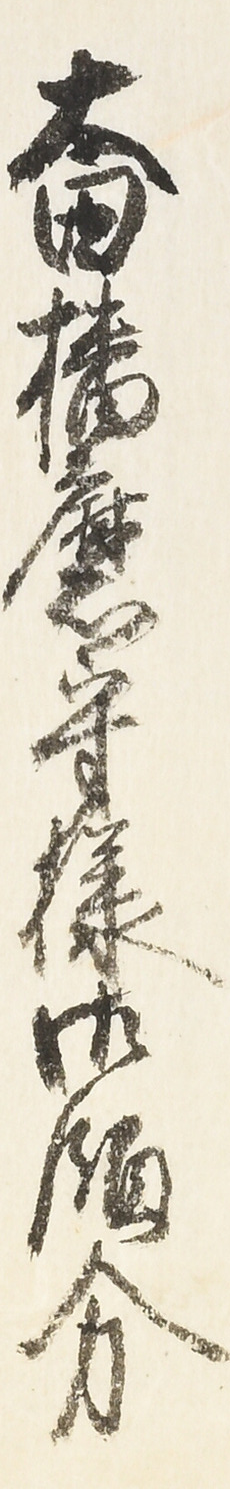太田播磨守様御領分
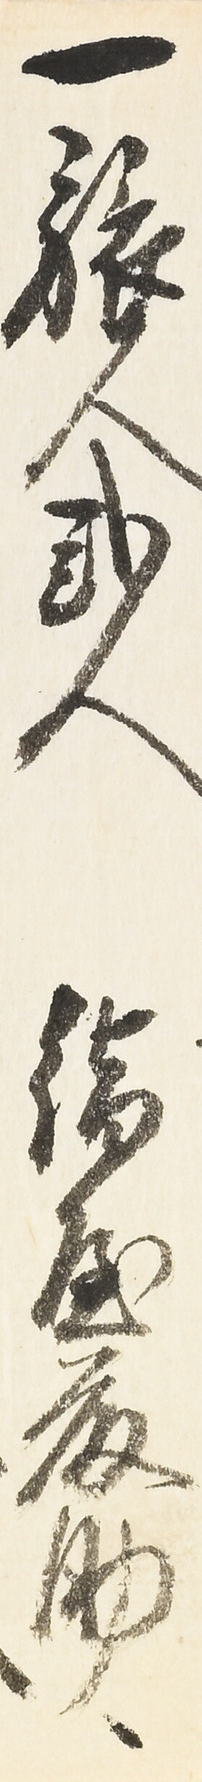一旅人弐人絹屋籐助・
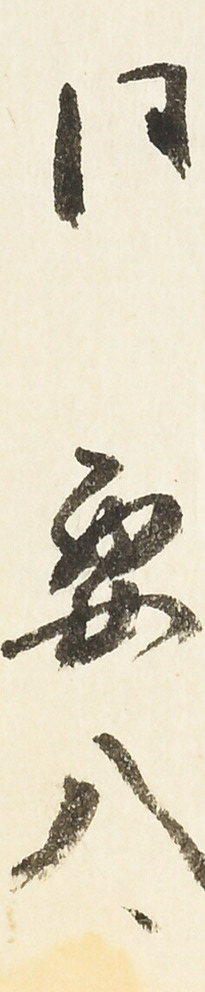同要八・
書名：町中旅人泊控帳
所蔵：伊那市立高遠町図書館・合同会社AMANE
